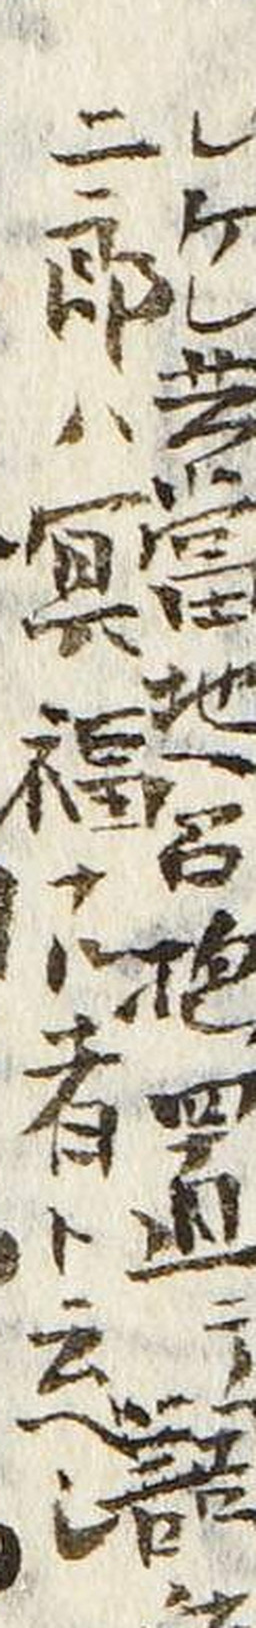二郎ハ冥福ナル者ト云ベシ
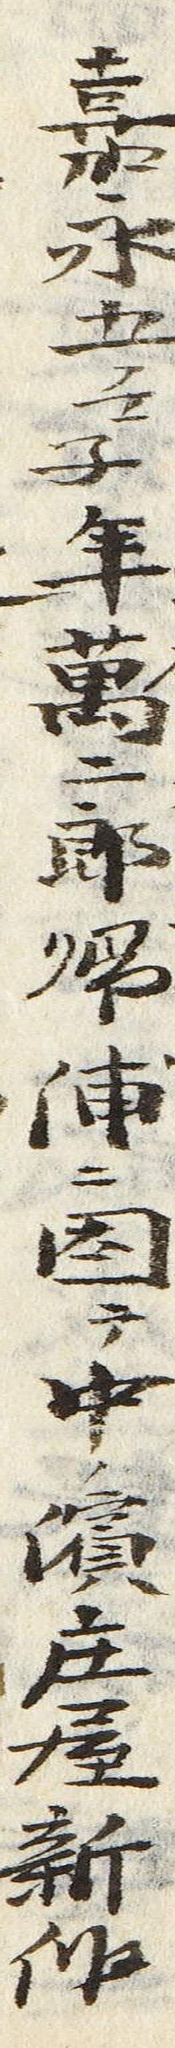嘉永五壬子年萬二郎帰浦ニ因テ中濱庄屋新作
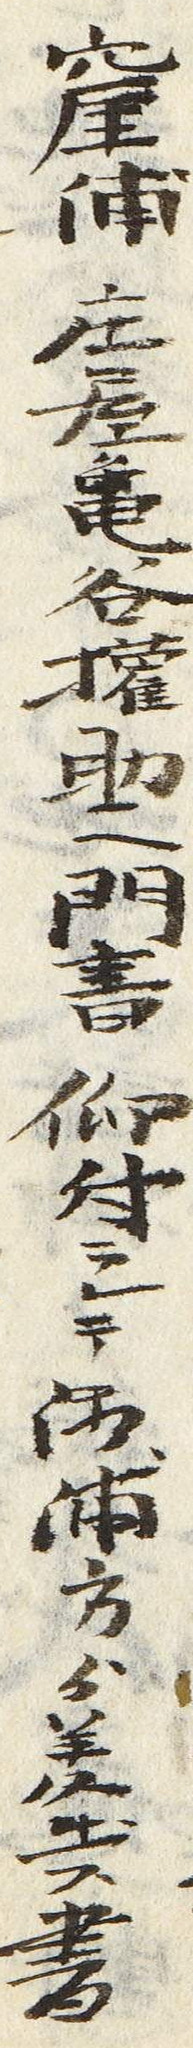崖浦庄屋亀谷權助ヘ門書仰付ラレテ御浦方ゟ差出ス書
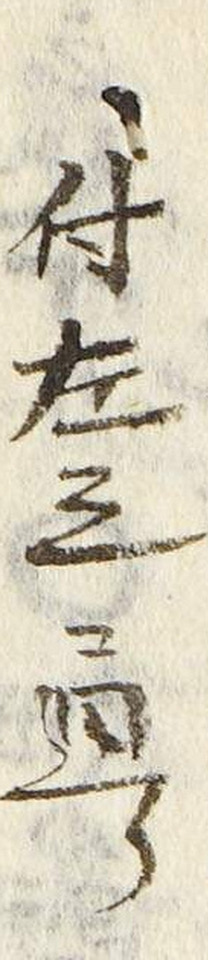付佐之通リ
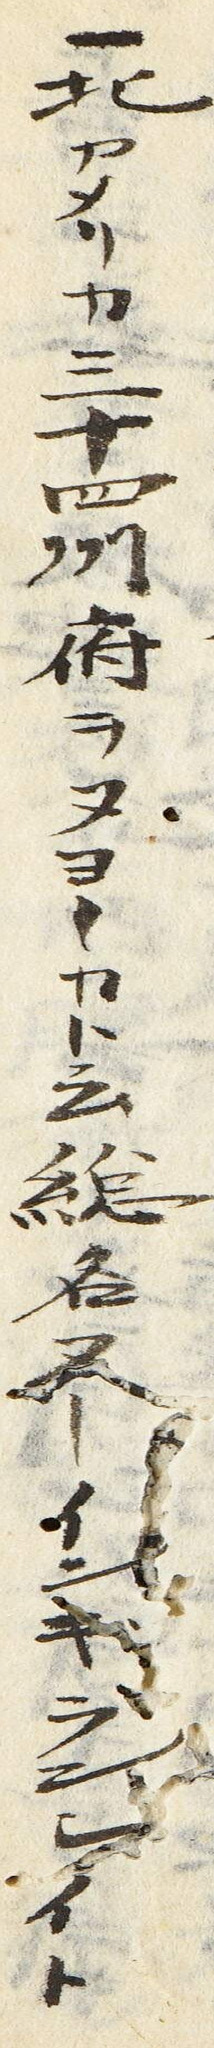一北アメリカ三十四州府ヲヌヨ❘カト云総各ス❘インギランシイト

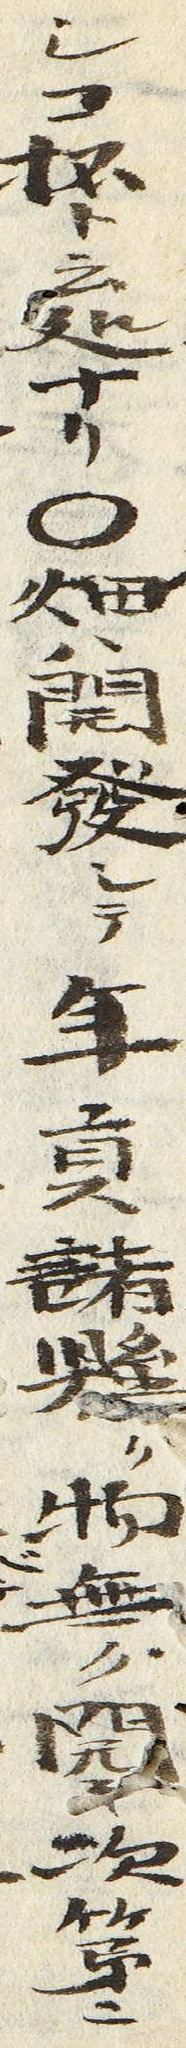シコ抔ト云処ナリ〇畑ハ開発シテ年貢諸懸リ物無ク開キ次第ニ
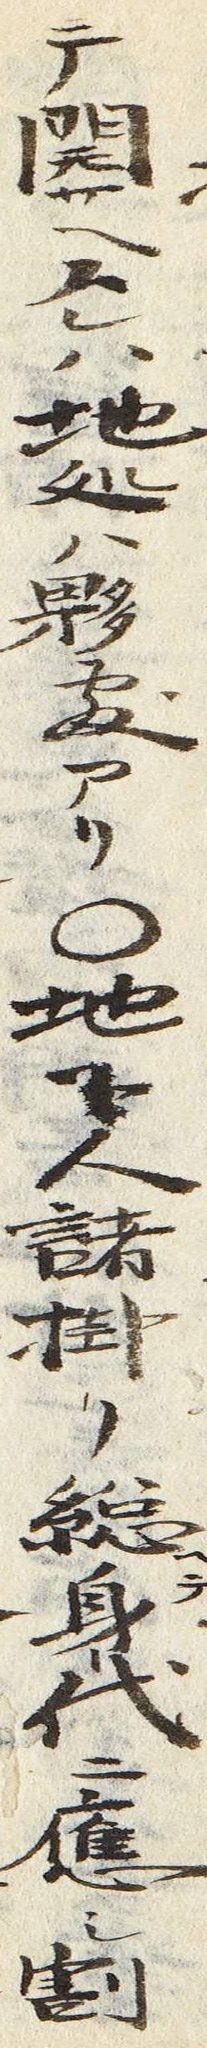テ開サヘスレハ地処ハ夥敷アリ〇地下人諸掛ノ総ベテ身代ニ応シ割
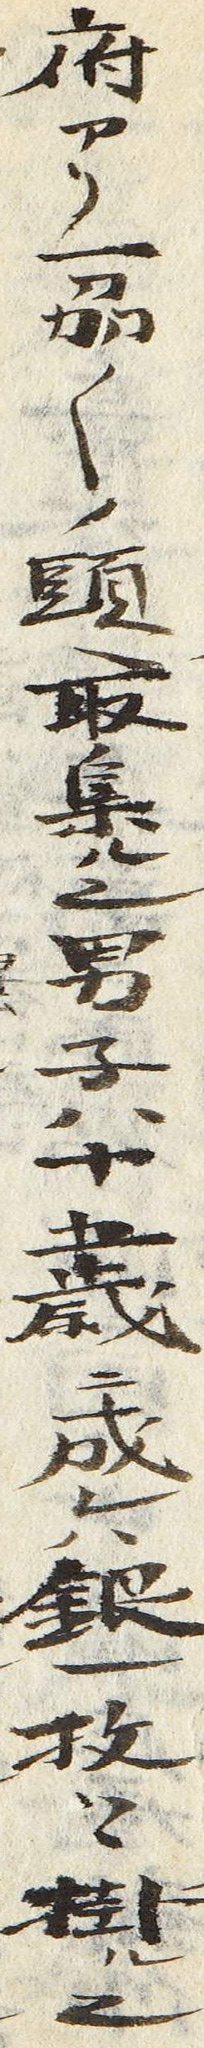府アリ一州〳〵ノ頭ヘ取集ル也男子ハ十五歳ニ成レハ銀一枚ツヽ掛ル也
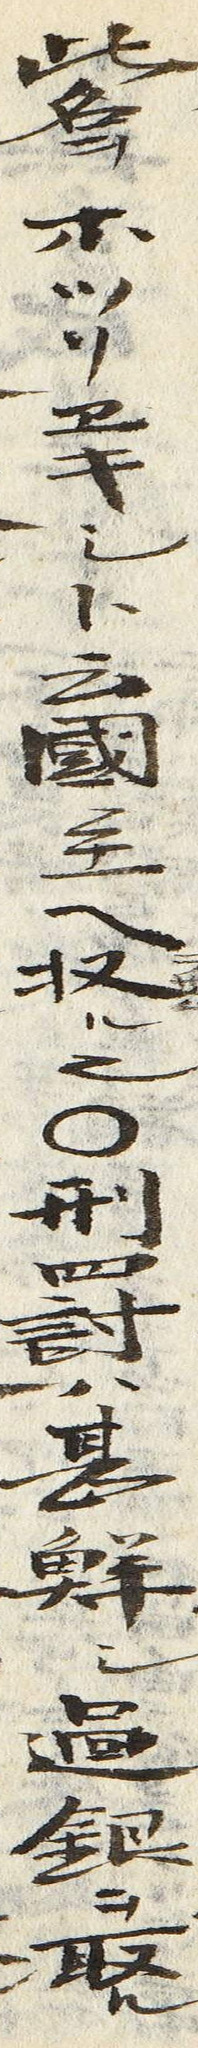此名ヲホツリエキシト云国主ヘ収ル也〇刑罰ハ甚鮮シ過銀ヲ取ル
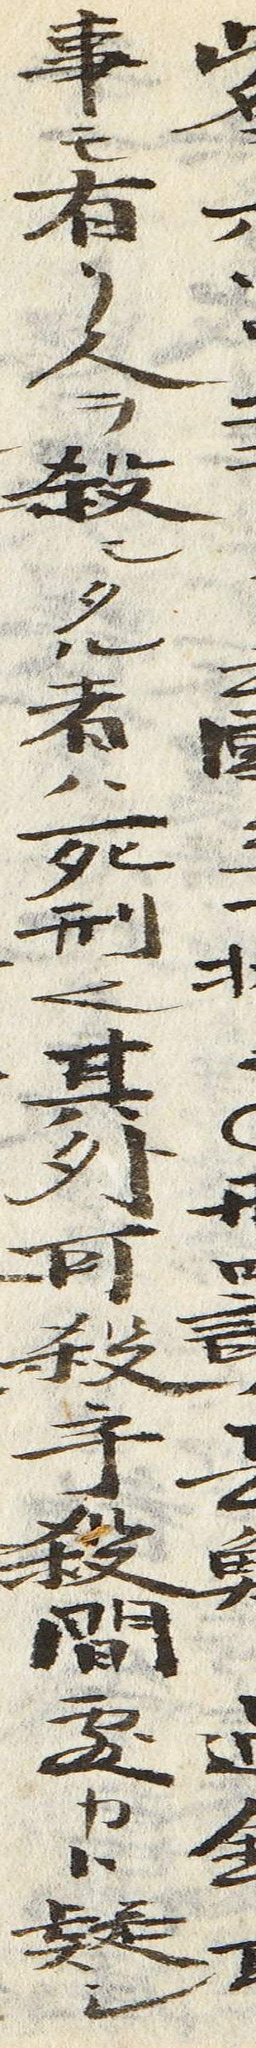事モ有リ人ヲ殺シタル者ハ死刑也其外殺手段間敷カト疑シ
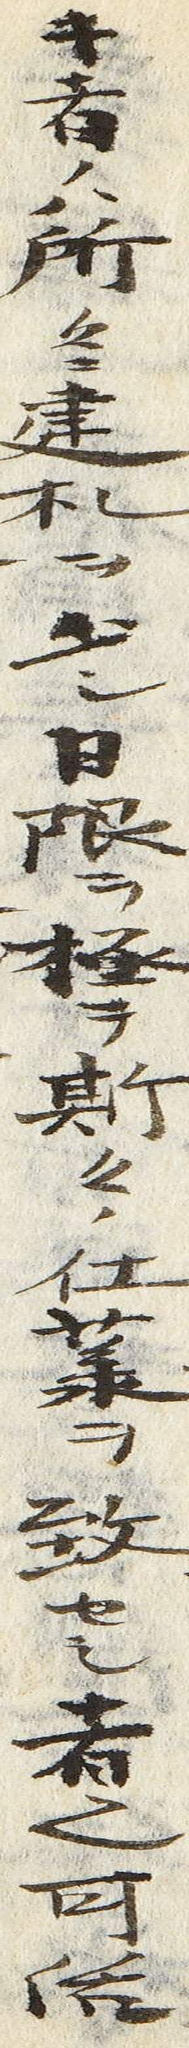キ者ノハ所々ニ立札ヲ出シ日限ヲ極テ斬々ノ仕業ヲ致セシ者也可活
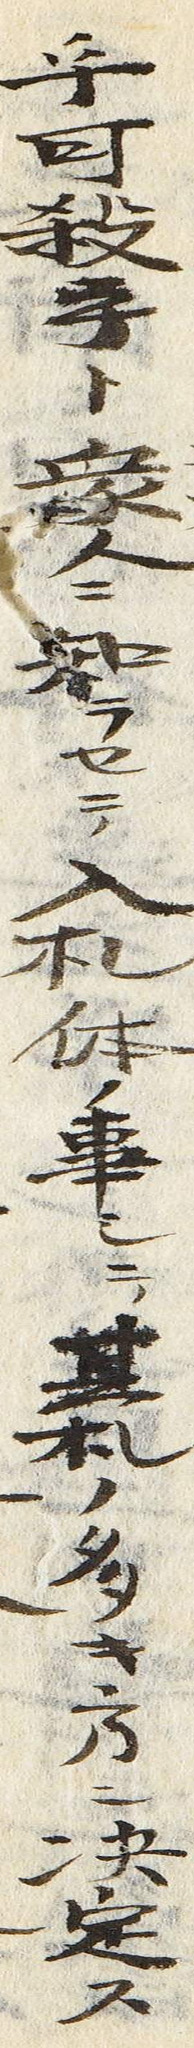乎可殺乎ト衆人ニ知ラセテ入札体ノ事シテ其札ノ多キ方ニ決ス
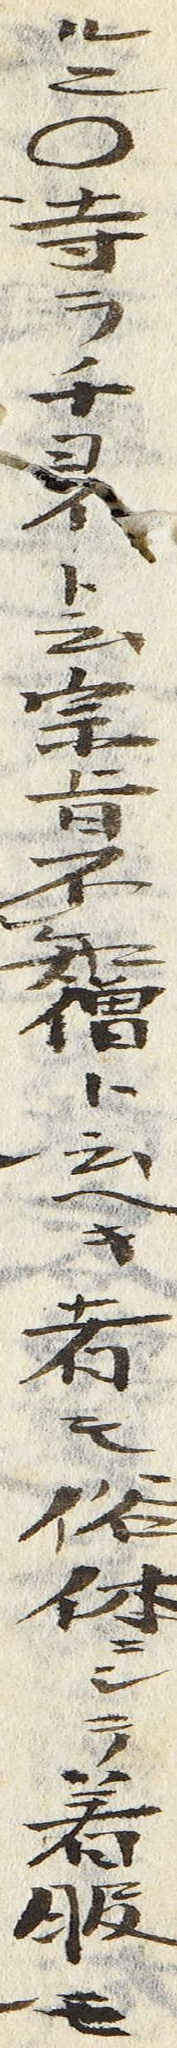ル也〇寺ヲチヨイト云宗旨不知僧ト云ヘキ者モ俗体ニシテ着服モ
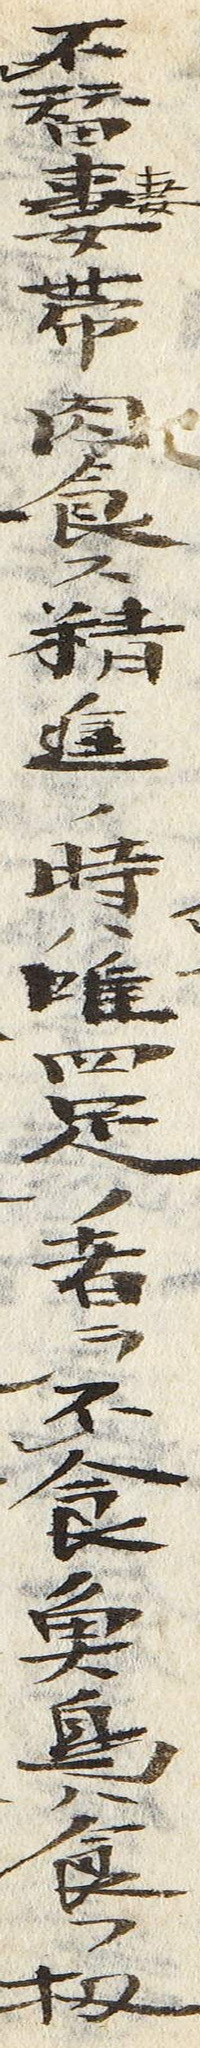不替妻帯肉食ス精進ノ時ハ唯四足ノ者ヲ不食魚鳥ハ食フ扨
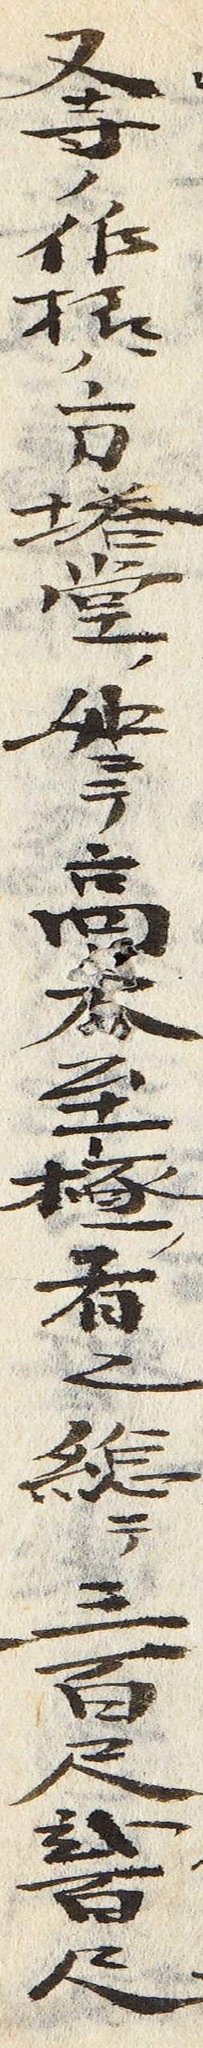又寺ノ作様ノ方塔堂ノ如ニテ高木至極ノ者也総テ三百尺弐百尺
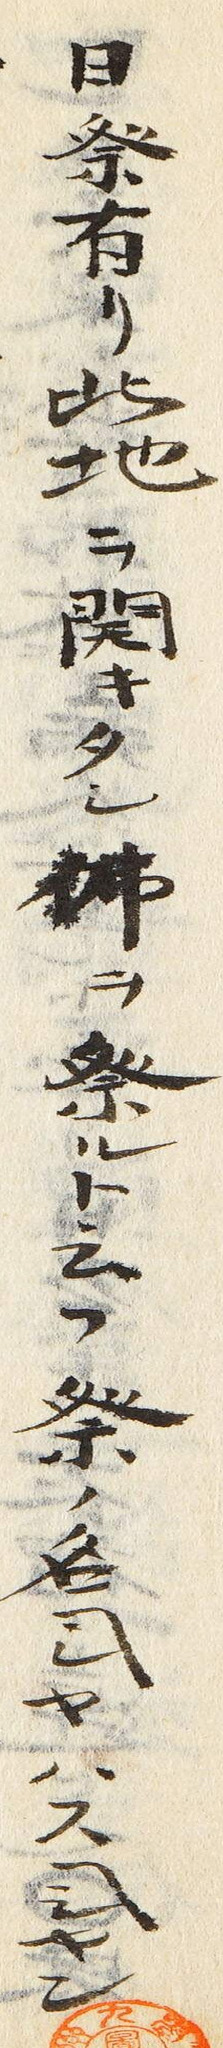日祭有リ此地ヲ開キタシ佛ヲ祭ルト云フ名シヤハスシヤン
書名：漂流記聞
